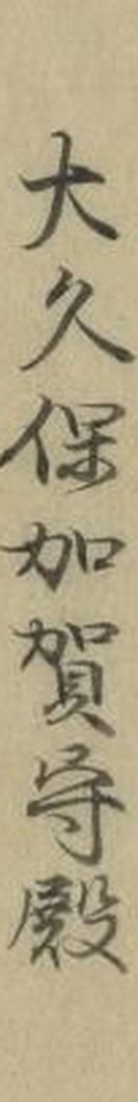大久保加賀守殿
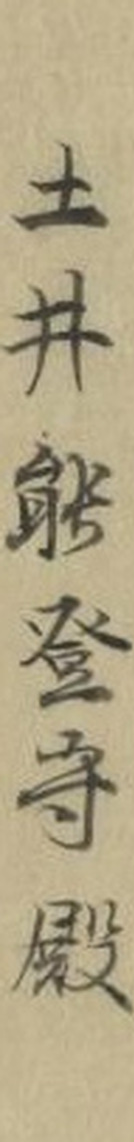土井能登守殿
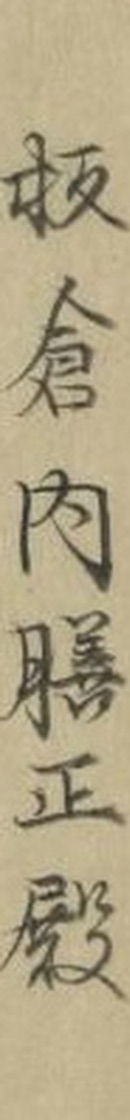板倉内膳正殿
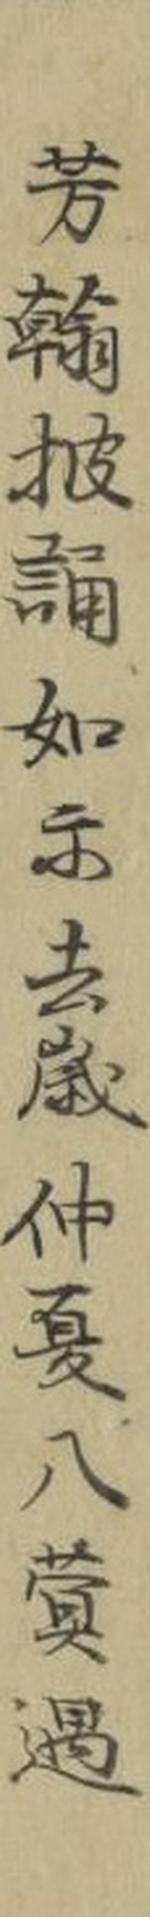芳翰披誦如示去歳仲夏八蓂遇
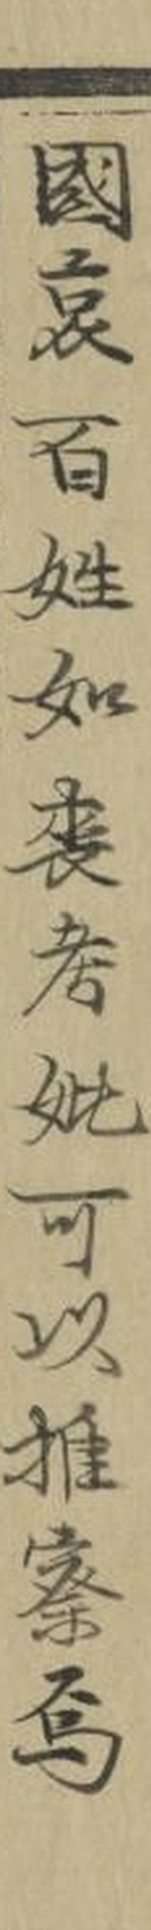国哀百姓如喪考妣可以推察焉
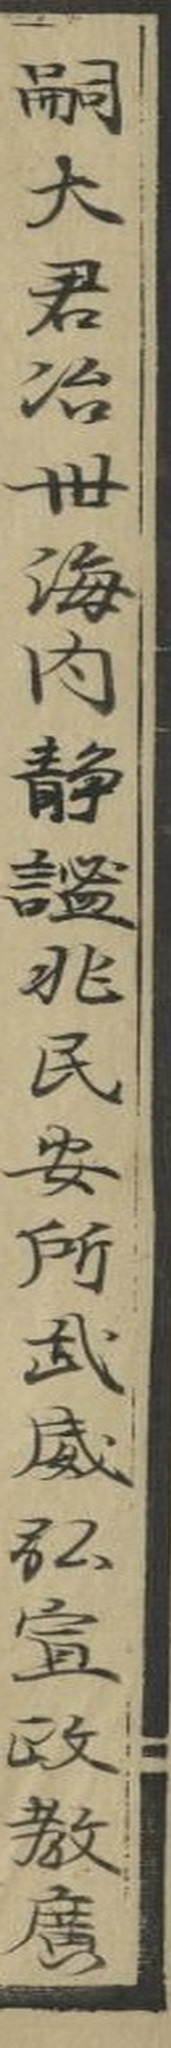嗣大君治世海内静謐兆民安所武威弘宣政教広
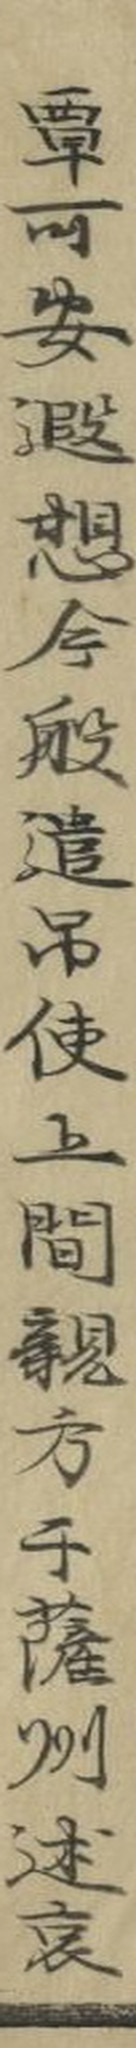覃可安遐想今般遣弔使上間親方于薩州延哀
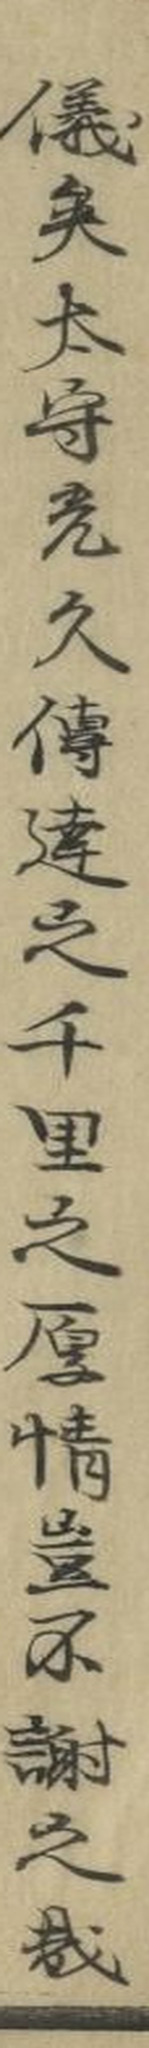儀矣太守充久伝達之千里之厚情豈不謝之哉
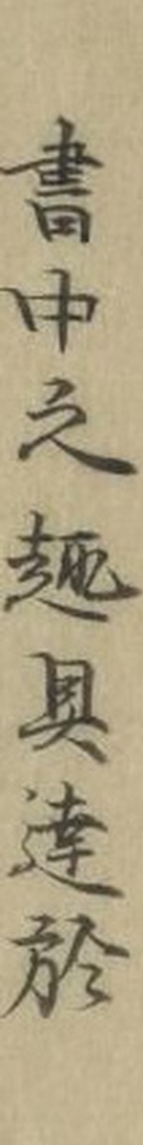暑中之趣具達於
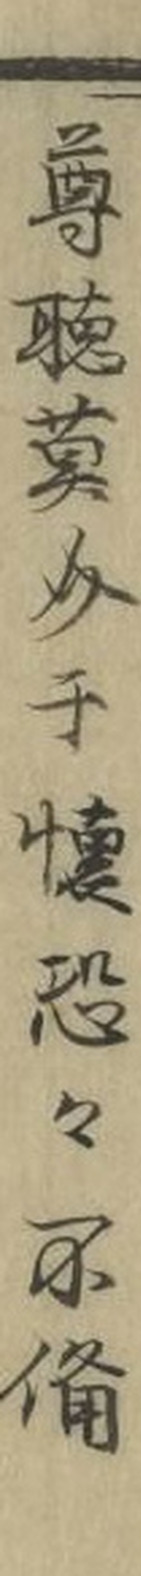尊聴莫介于懐恐々不備
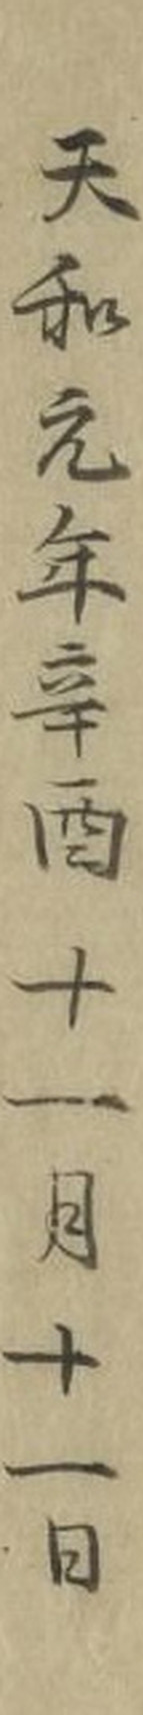天和元年辛酉十一月十一日
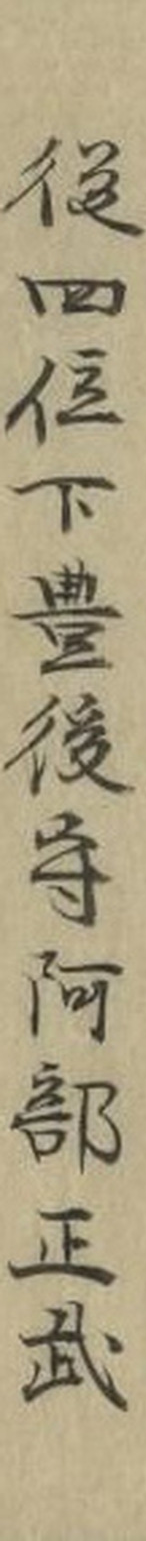従四位下豊後守阿部正武
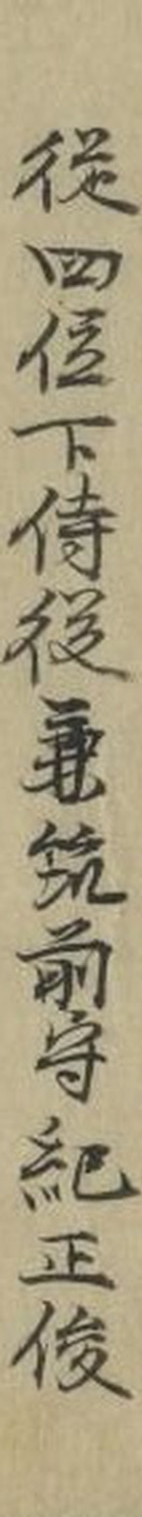従四位下侍従兼筑前守紀正俊
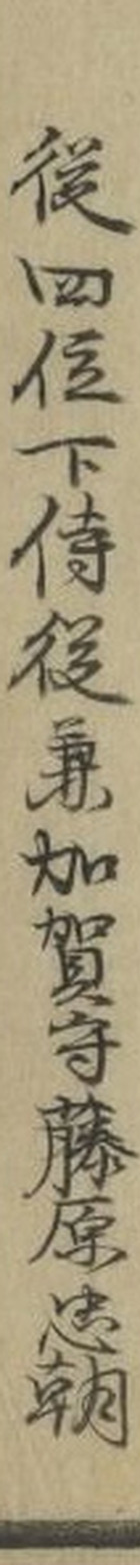従四位下侍従兼加賀守藤原忠朝

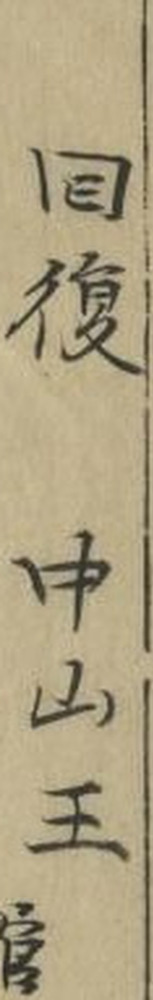回復中山王
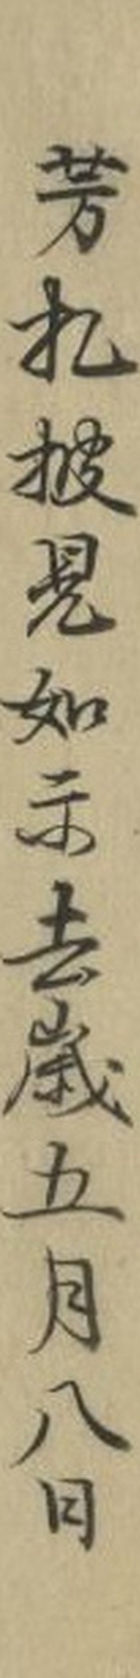芳札披見如示去歳五月八日
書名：琉球往来（下）
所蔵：University of the Ryukyus Library
